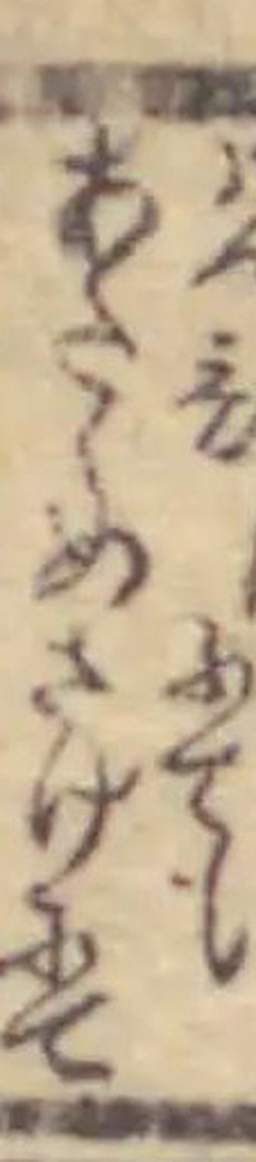あたゝめさけにて
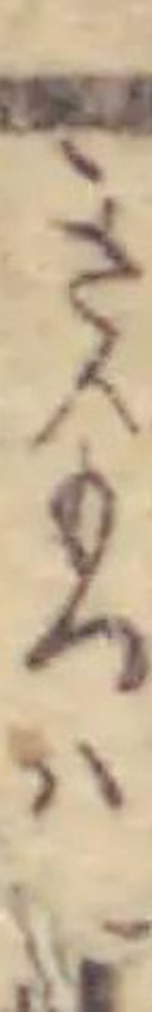きんもつは
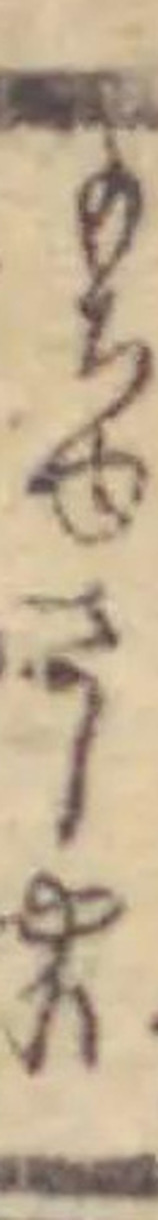もちゆさしやい
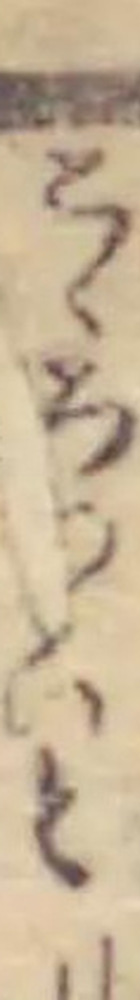こゝろつかいと
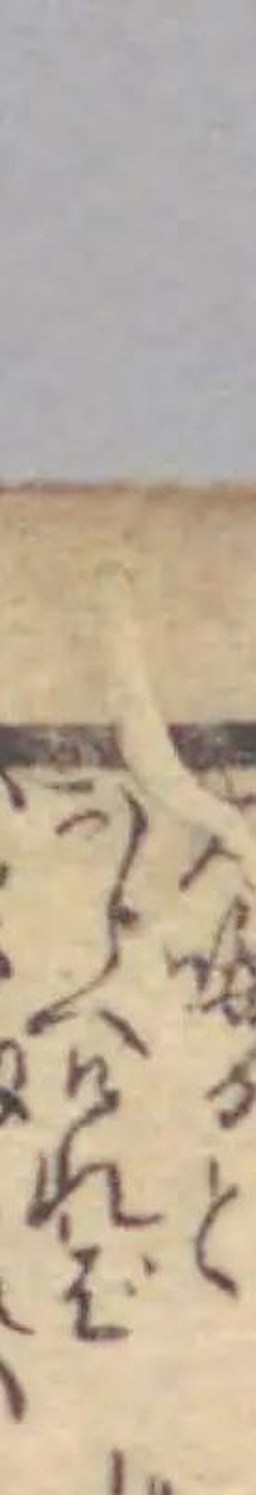おしへければ
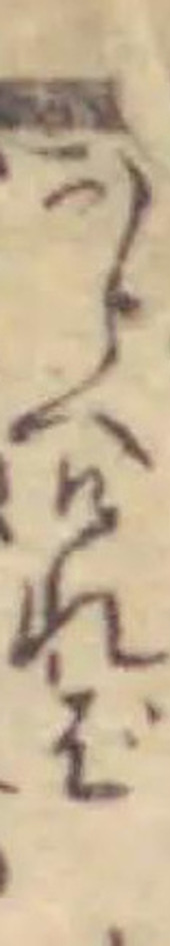おしへければ
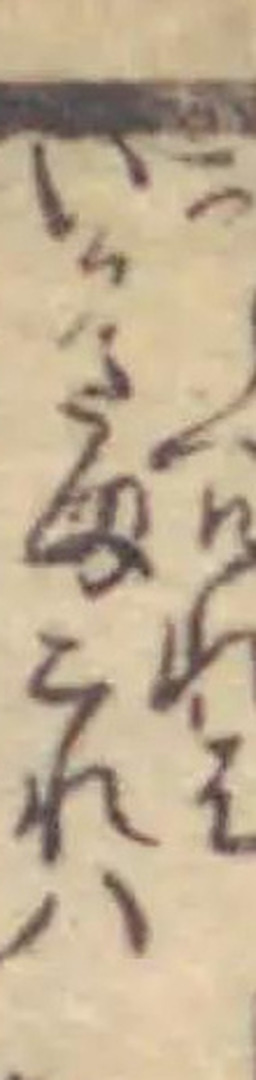いかさまこれは
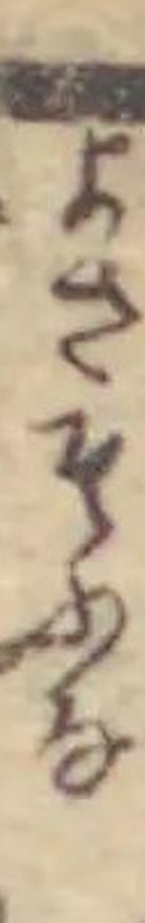よさそふな
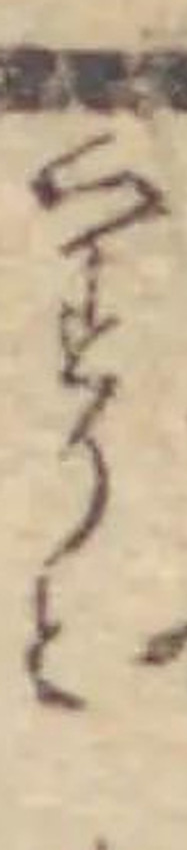くすりと
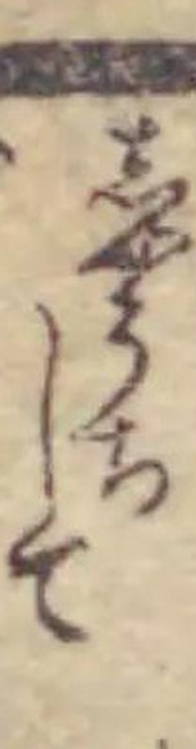しやうち
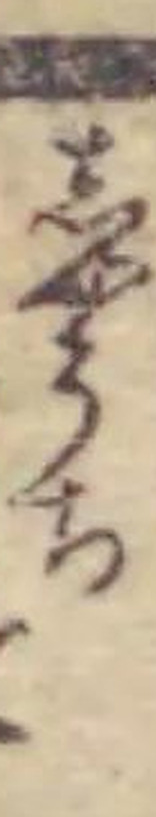しやうち
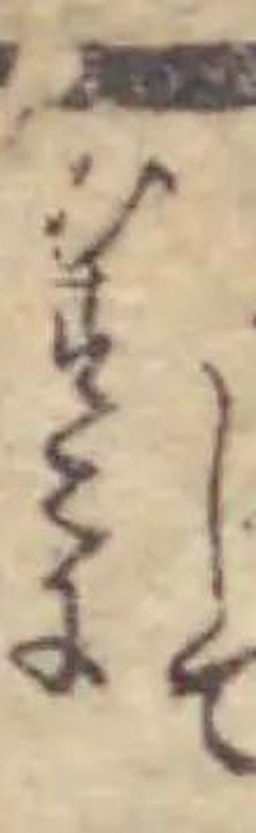むすこに
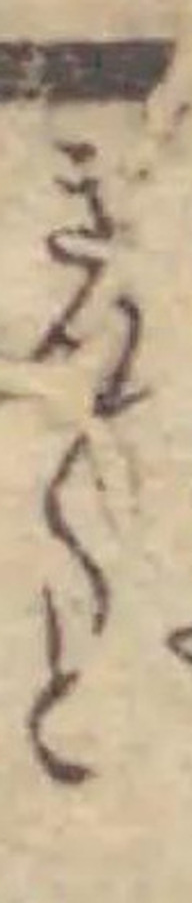きん〳〵と
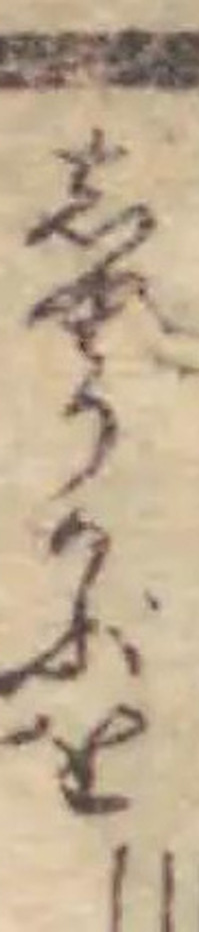しやうかぶを
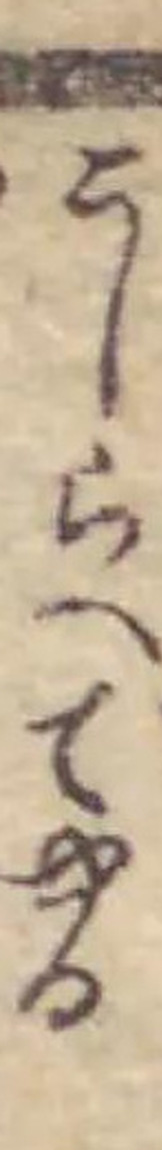こしらへてやる
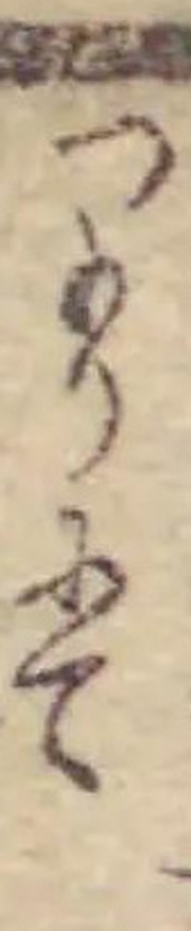つもりにて
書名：家伝寿命薬 2巻
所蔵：国立国会図書館 National Diet Library, JAPAN
